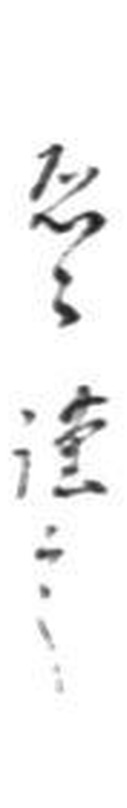恐々謹言
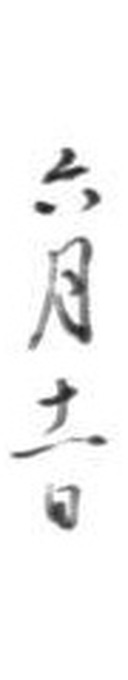六月十一日
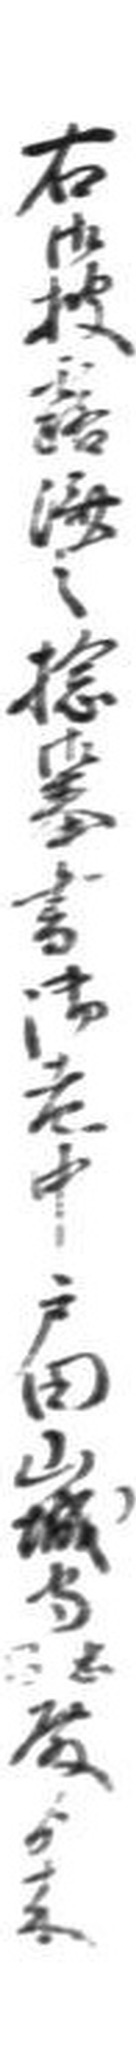右御披露済之捻御奉書御老中戸田山城守忠昌殿ゟ来
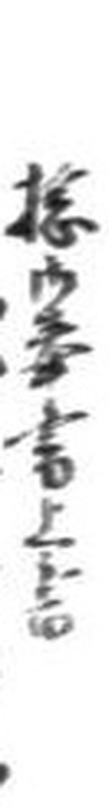捻御奉書上書

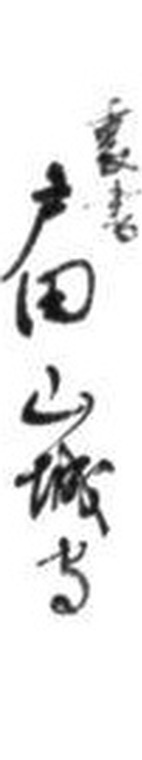戸田山城守
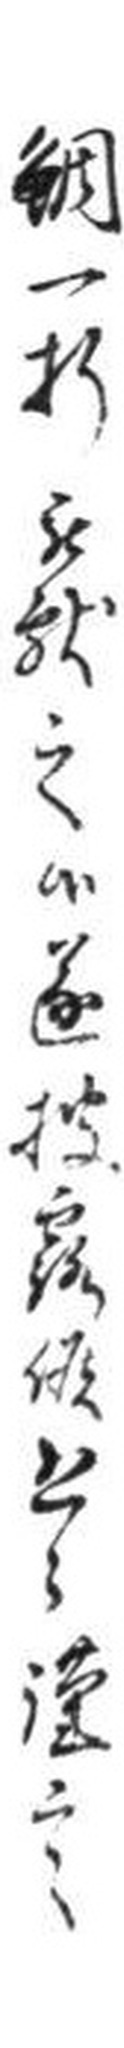鯛一折被献之候遂披露候恐々謹言
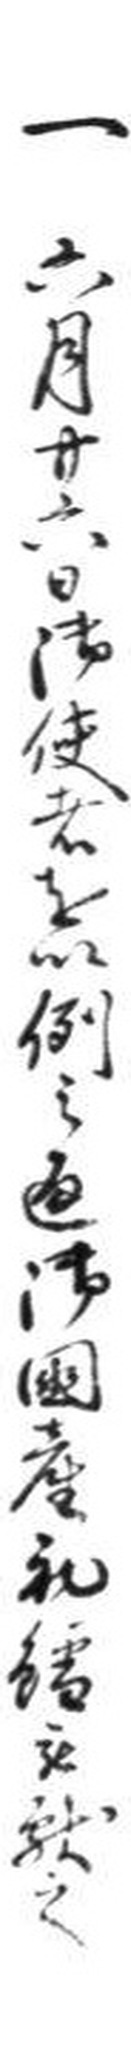一六月廿六日御使者を以例之通御国産初鱈被献之
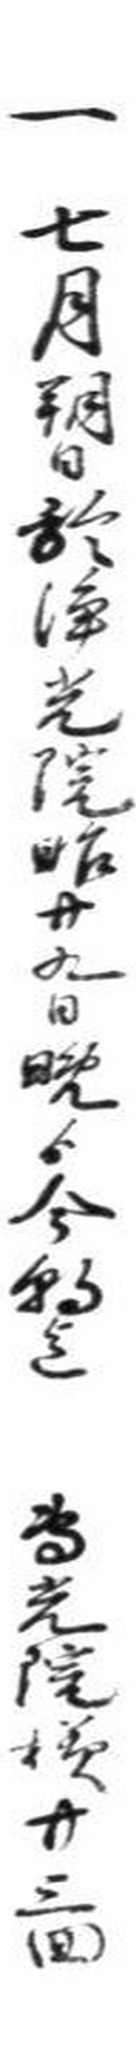一七月朔日於浄光院昨廿九日晩ゟ今朝迄専光院様廿三回
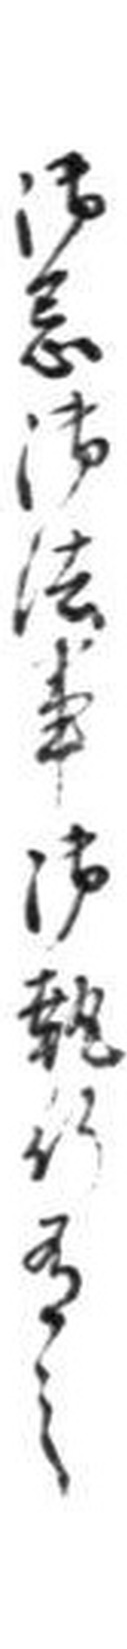御忌御法事御執行有之
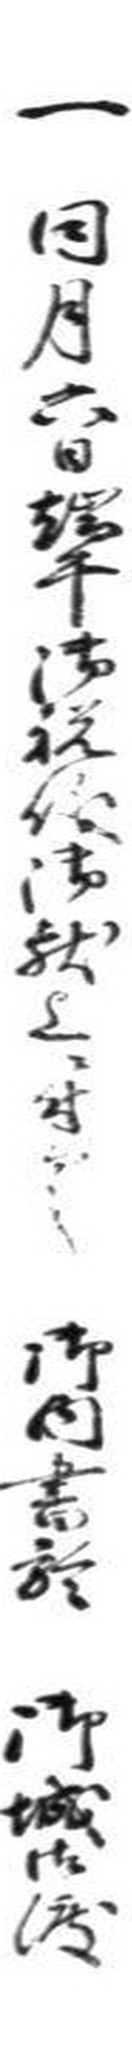一同月六日端午御祝儀御献上ニ付而之御内書於御城御渡
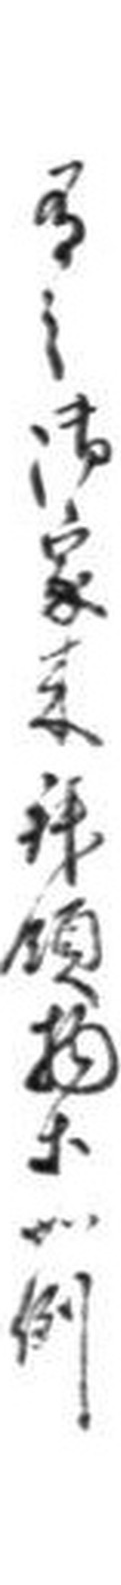有之御家来拝領物等如例
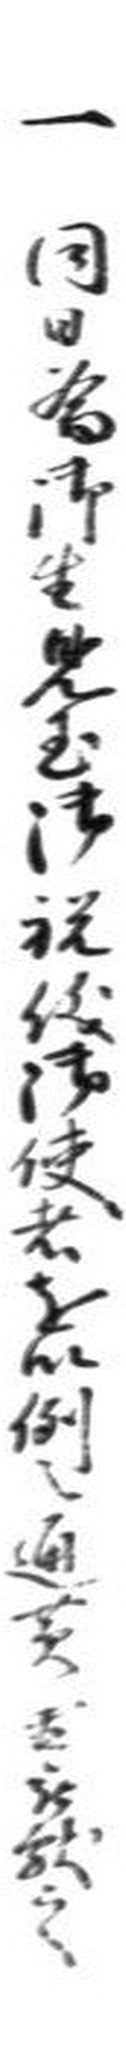一同日為御生見玉御祝儀御使者を以例之通黄金被献之
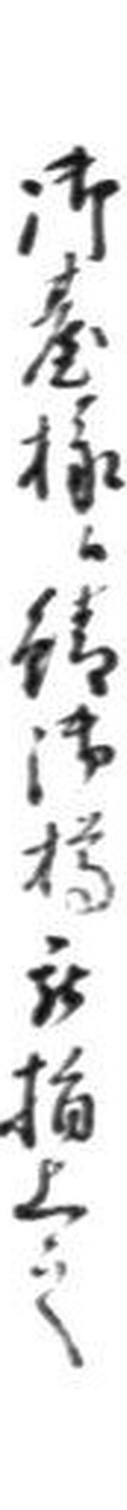御台様江鯖御樽被指上之
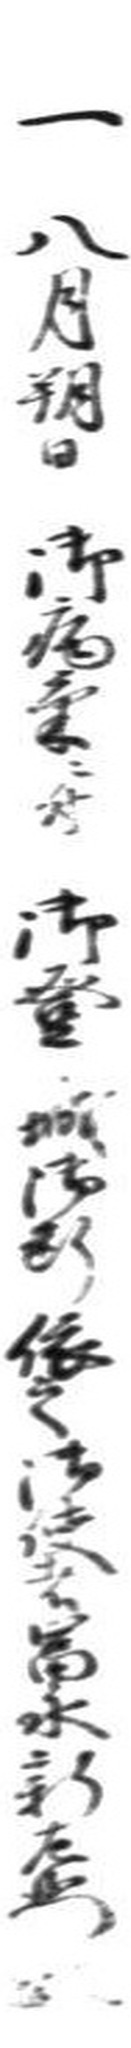一八月朔日御病気ニ付御登城御断依之御使者冨永新左衛門長盛
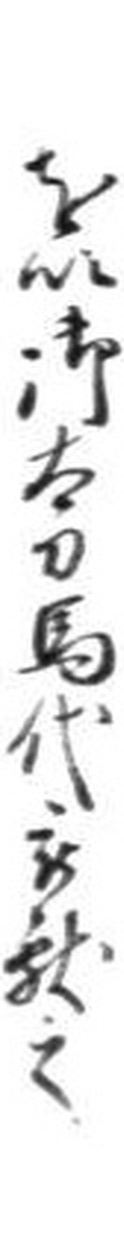を以御太刀馬代被献之
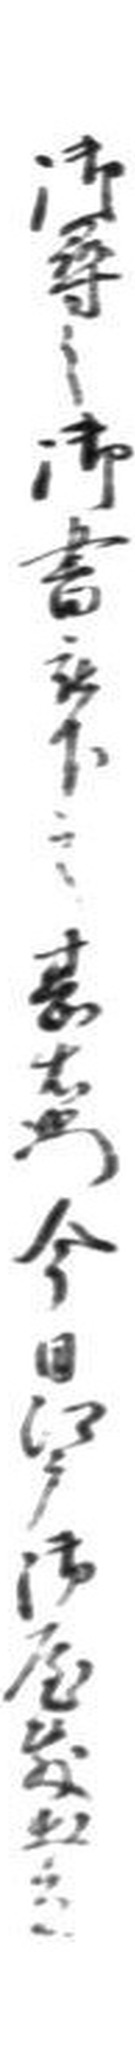御尋之御書被下之甚右衛門今日江戸御屋敷出立
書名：家譜 十五 綱昌公 従天和元年到元禄十二年
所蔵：福井県文書館 Fukui Prefectural Archives
